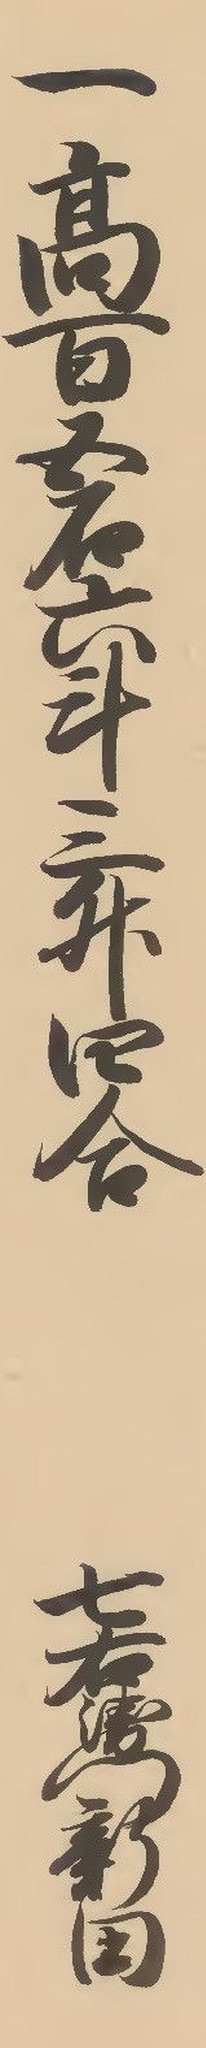一高百五石六斗三升四合七右衛門新田
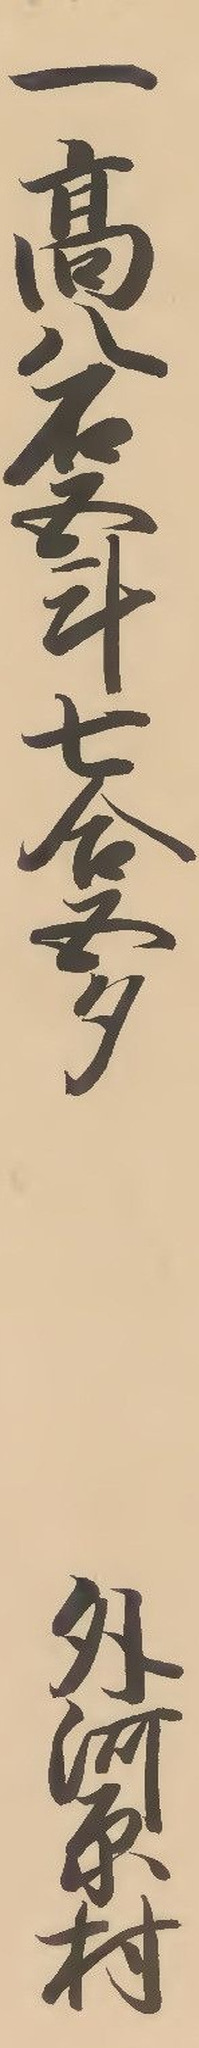一高八石五斗七合五勺外河原村
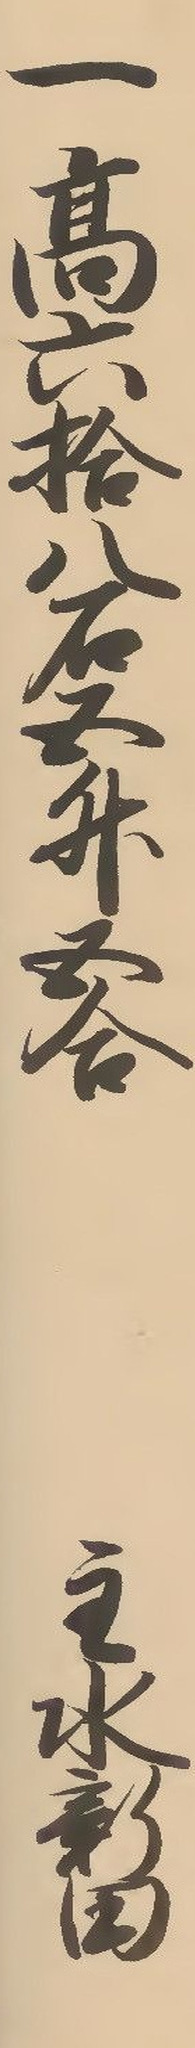一高六拾八石五升五合主水新田
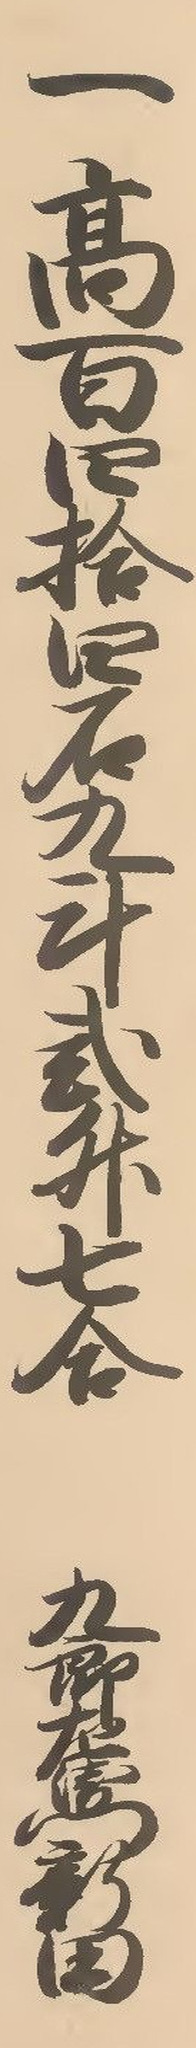一高百四拾四石九斗弐升七合九郎左衛門新田
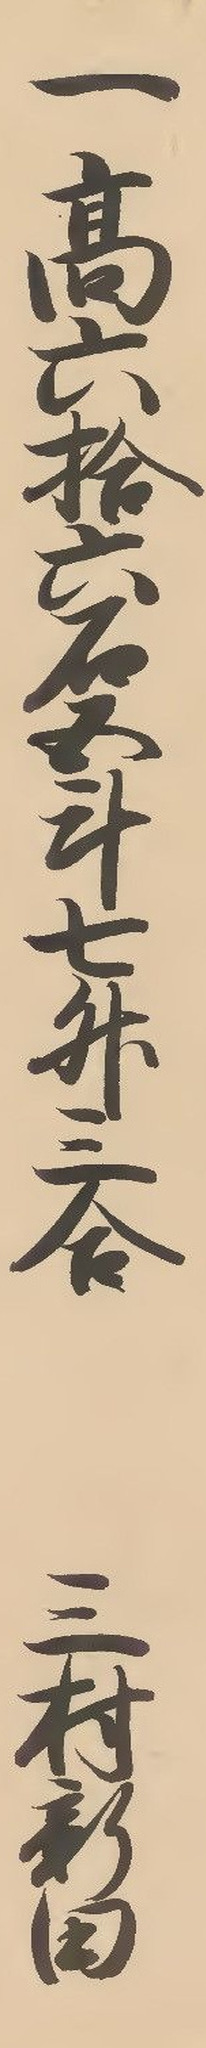一高六拾六石五斗七升三合三村新田
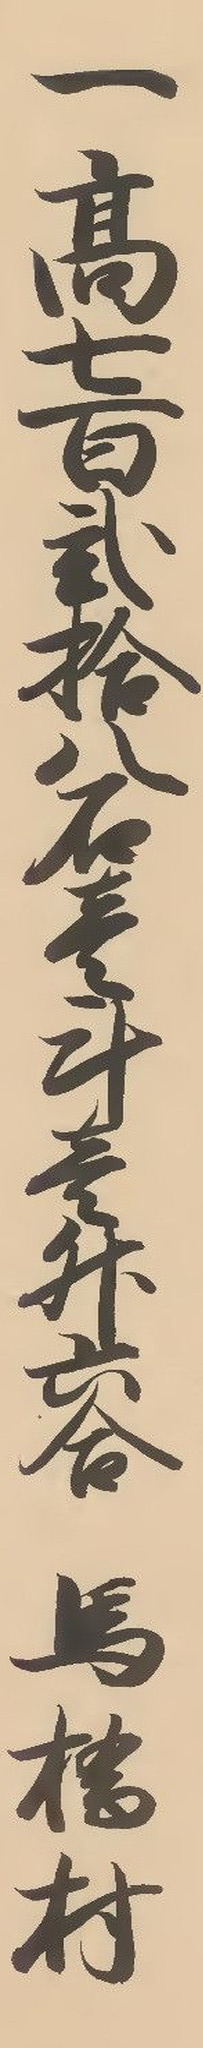一高七百弐拾八石壱斗壱升六合馬橋村
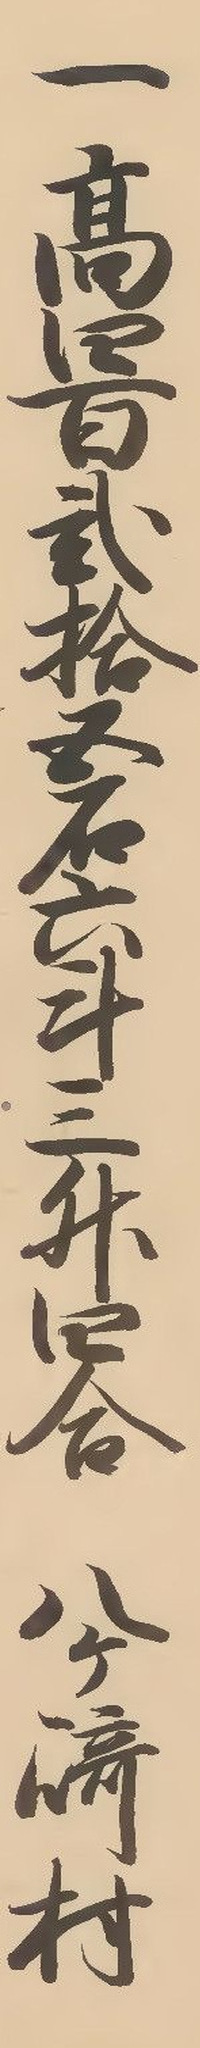一高四百弐拾五石六斗三升四合八ヶ崎村

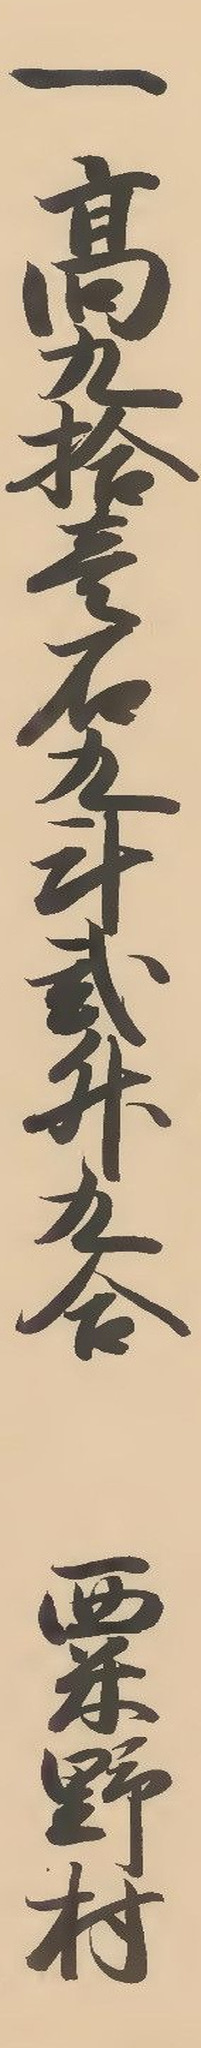一高九拾壱石九斗弐升九合粟野村
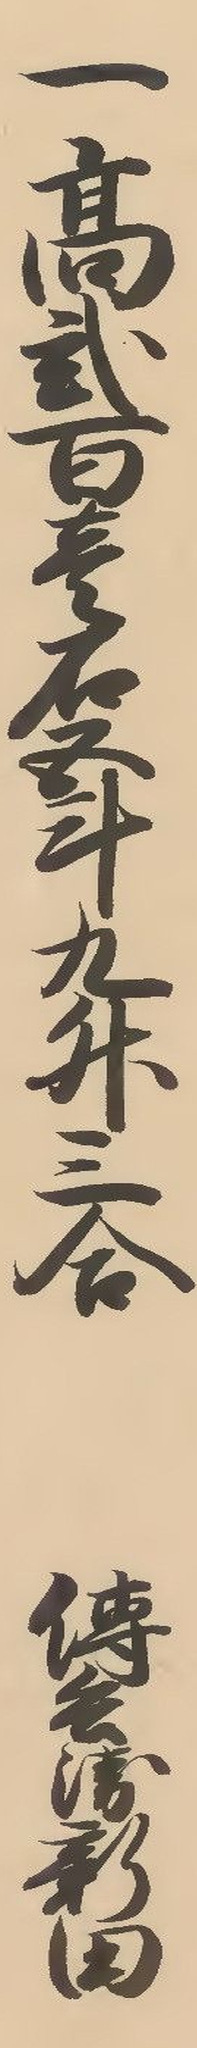一高弐百壱石五斗九升三合伝兵衛新田
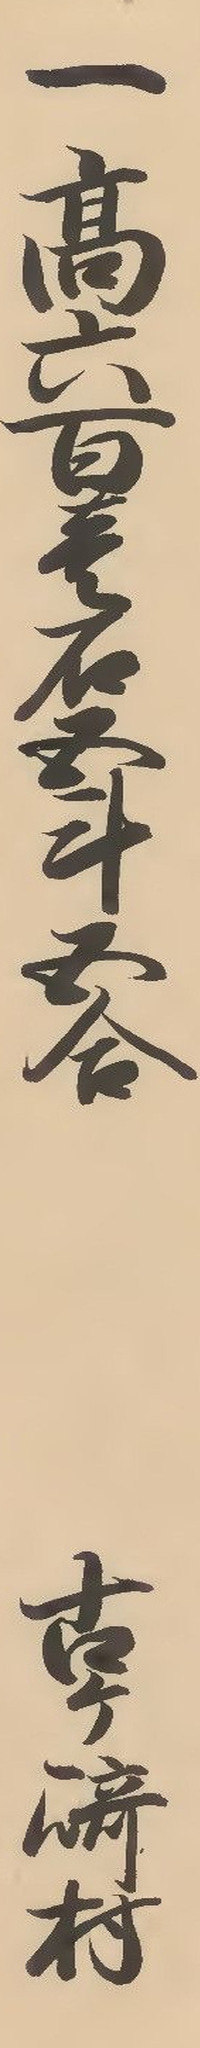一高六百壱石五斗五合古ヶ崎村
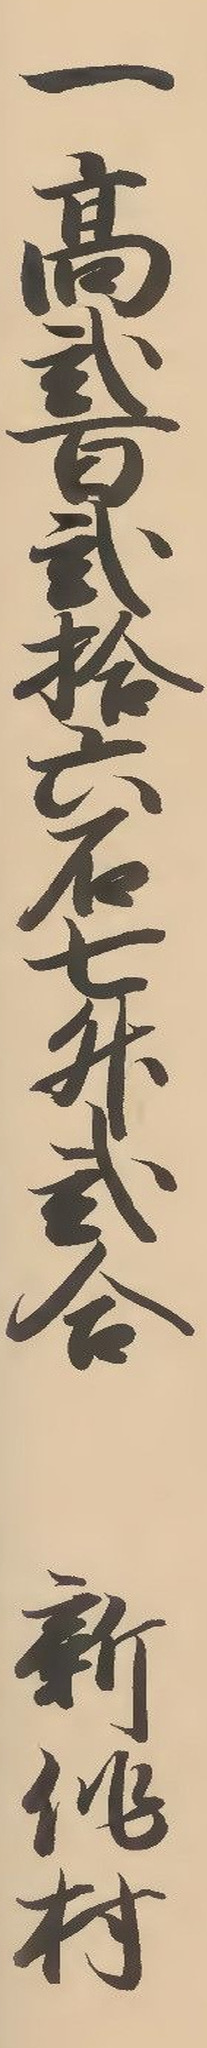一高弐百弐拾六石七升弐合新作村
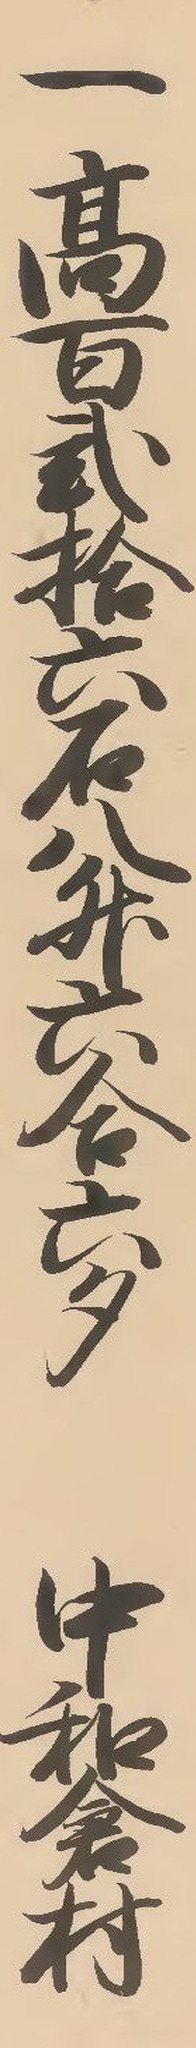一高百弐拾六石八升六合六勺中和倉村
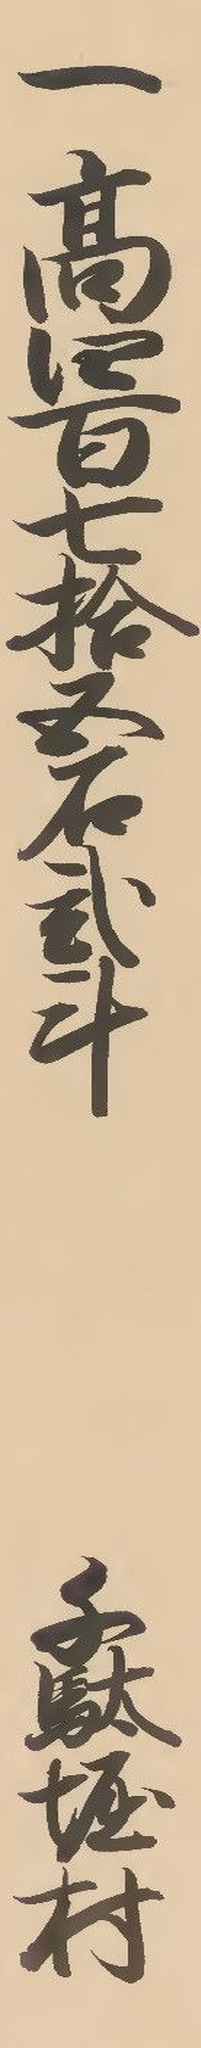一高四百七拾五石弐斗千駄堀村
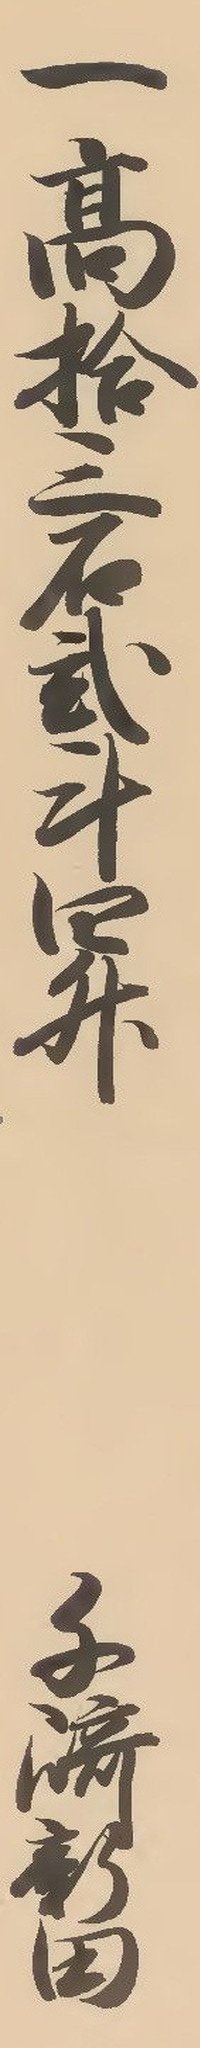一高拾三石弐斗四升千崎新田

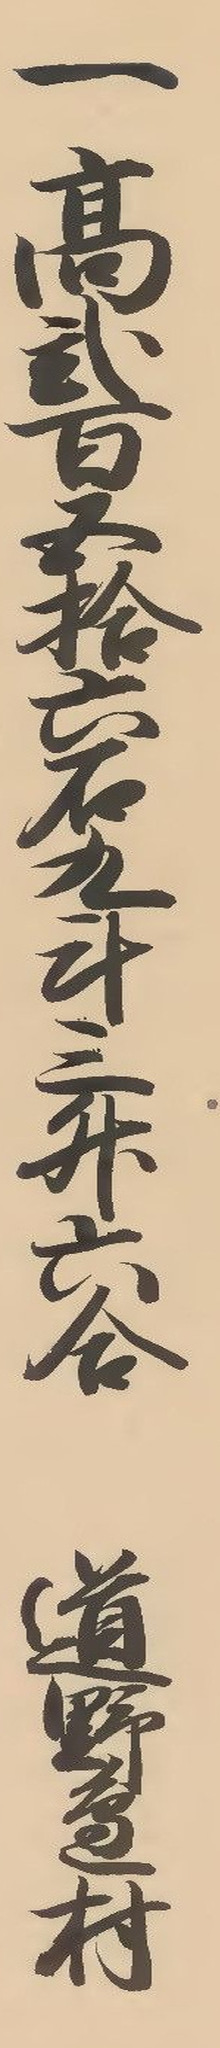一高弐百五拾六石九斗三升六合道野辺村
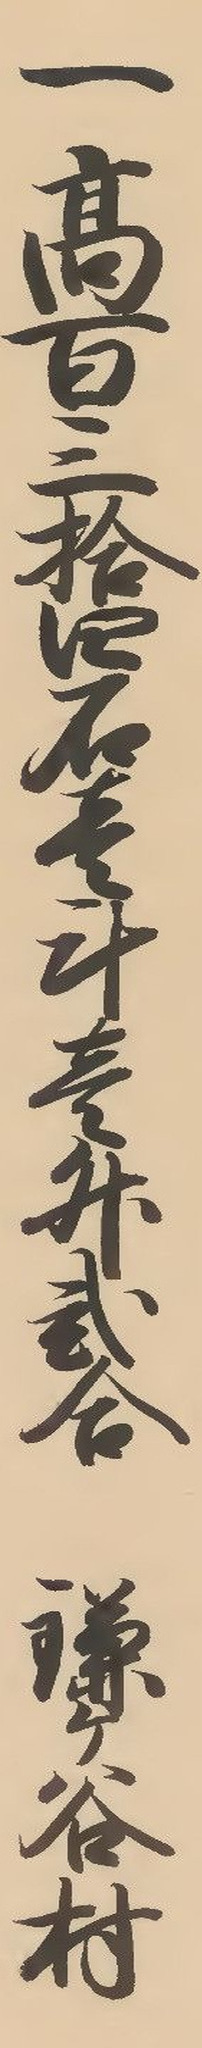一高百三拾四石壱斗壱升弐合鎌ヶ谷村
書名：下総国郷帳
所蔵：国立公文書館 National Archives of Japan
